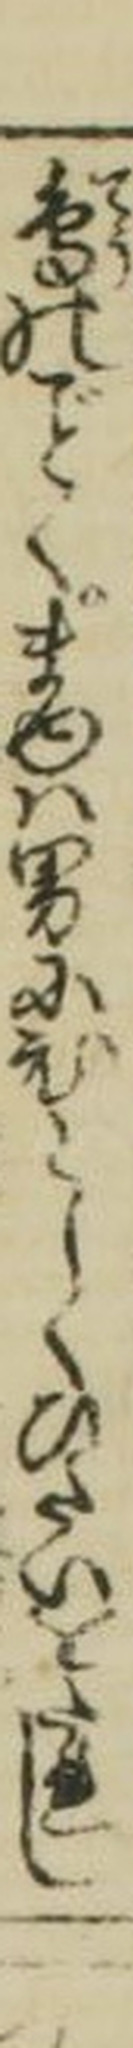鳥のごとく。まゆは男にひとしくひたいをたれし
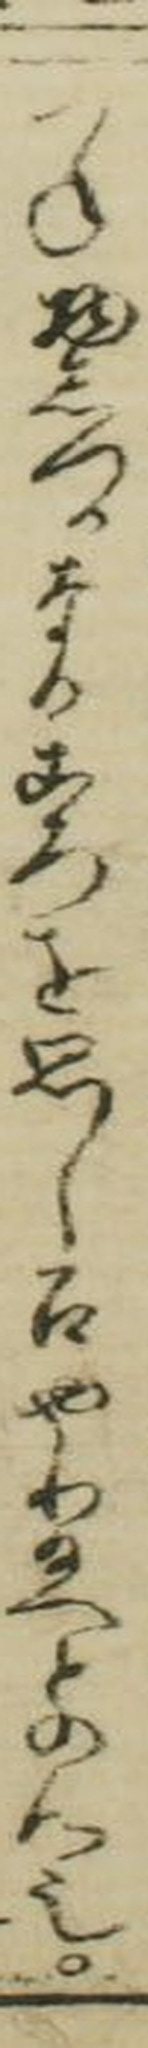つね物しつかなるころを思し召やり給へとの心也。
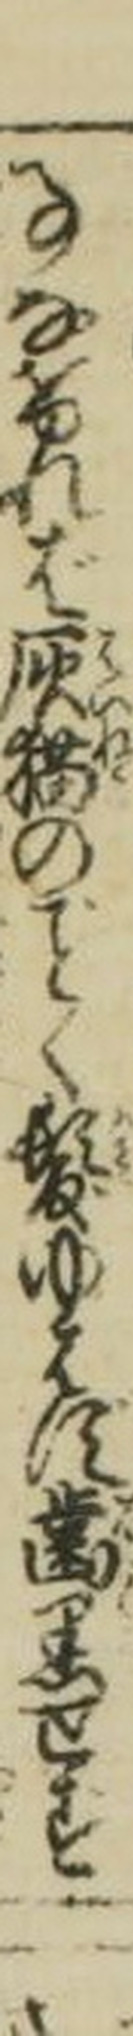事なければ灰猫のごとく髪ゆはず歯黒せず
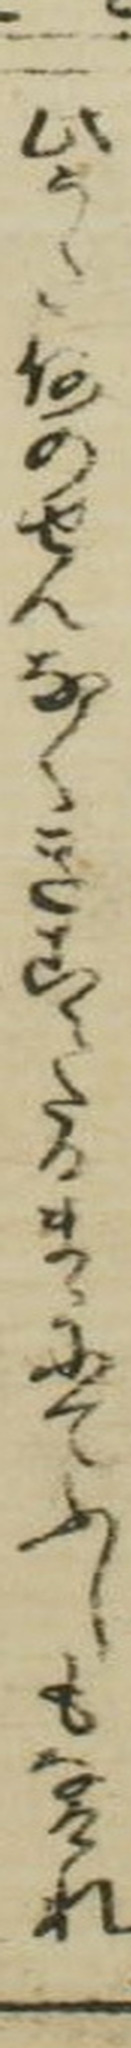此うた何のせんなくきこえたるまゝにてふしもなけれ
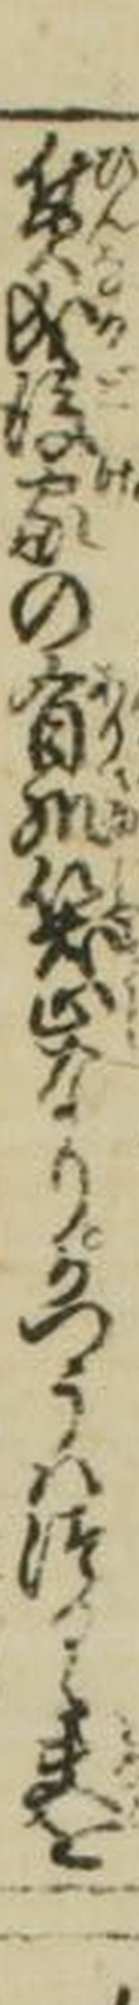貧成後家の有様笑止なり。かつうはつく夫を
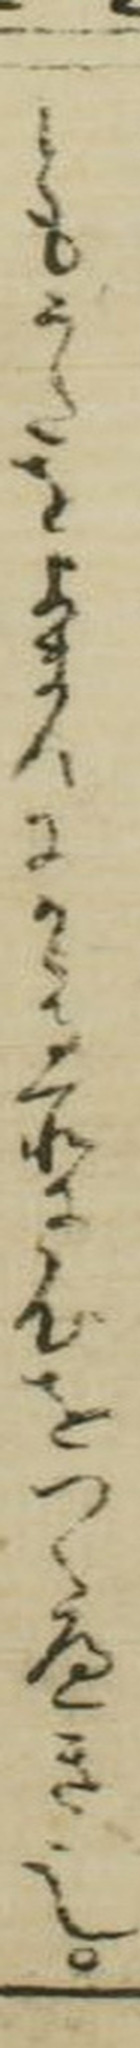とも。うたをよまんにかゝる所に心をつくへき也。
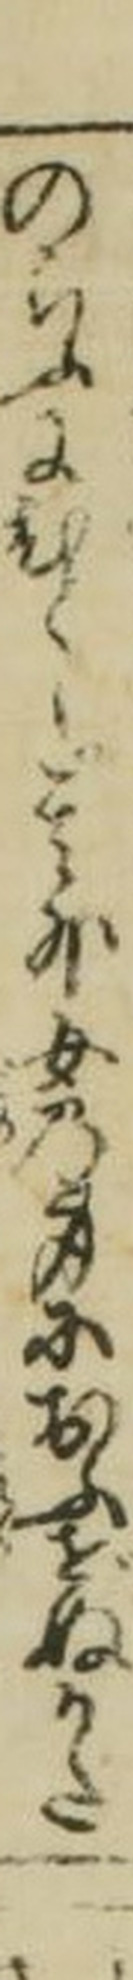のらふにひとし。其外女の身におふぜぬかた
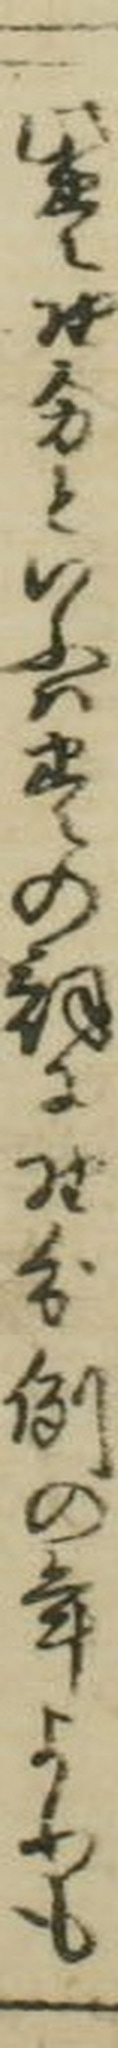此巻野分といふは巻の詞に野分例の年よりも
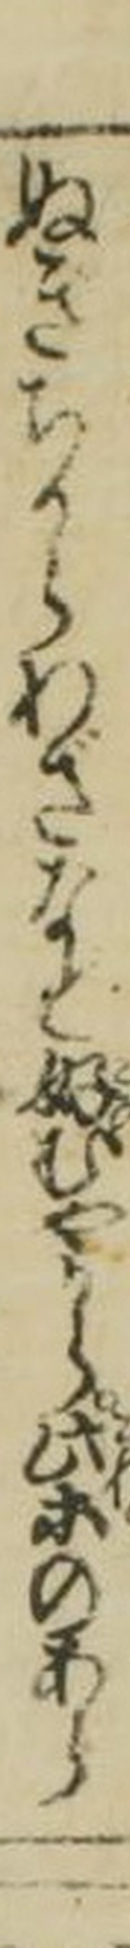ぬきちからわざなど好むやから。此等のあら
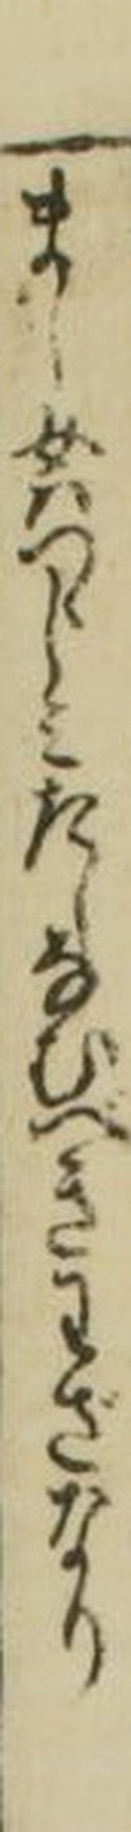まし女はつゝしみたしなむべきわざなり
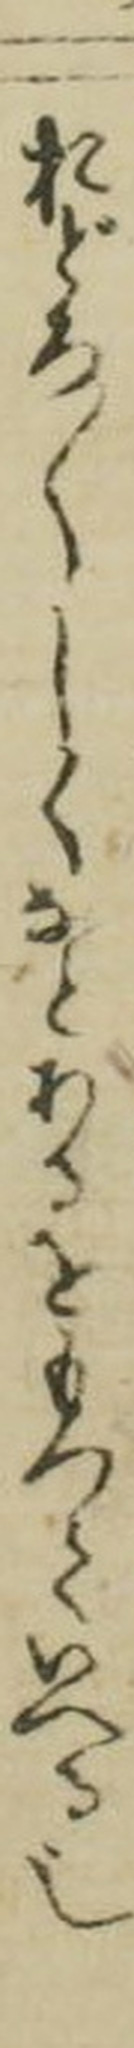おどろ〳〵しくなとあるをもつていへる也
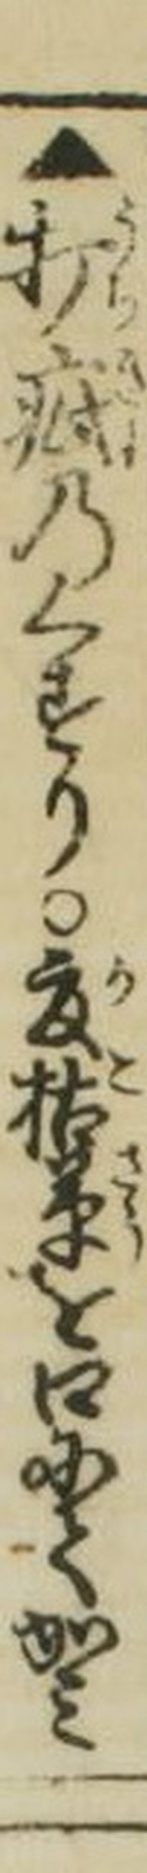▲打疵のくすり○夏枯草を口にてかみ
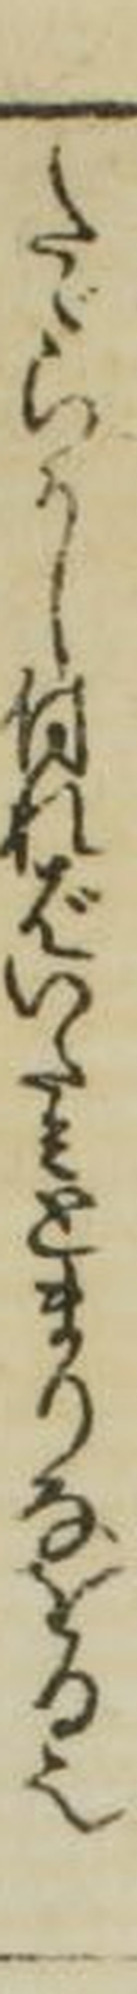たゞらかし付ればいたみとまりなをる也
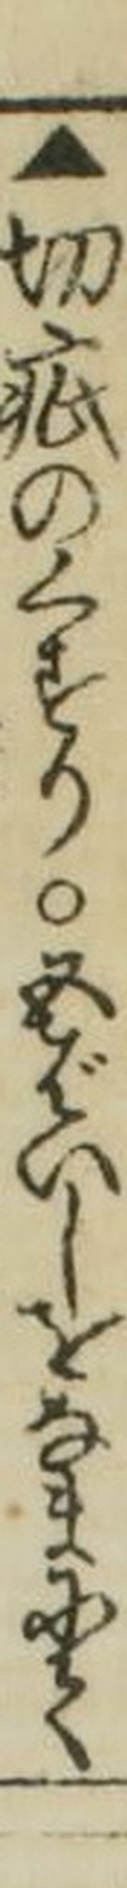▲切疵のくすり○五ばいしをなまにて
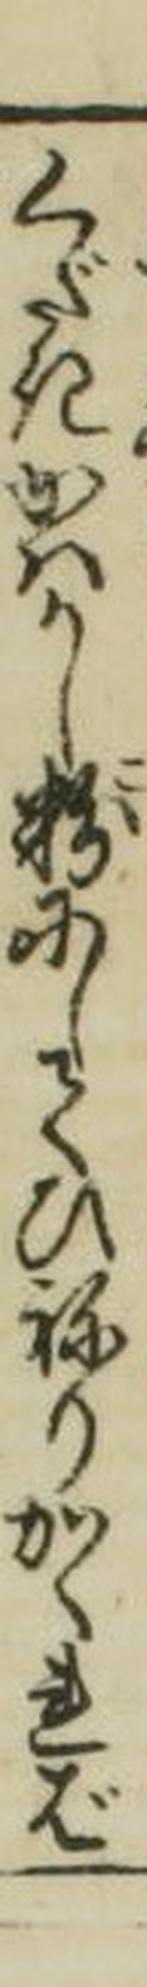くだきかはかし粉にしてひねりかくれば
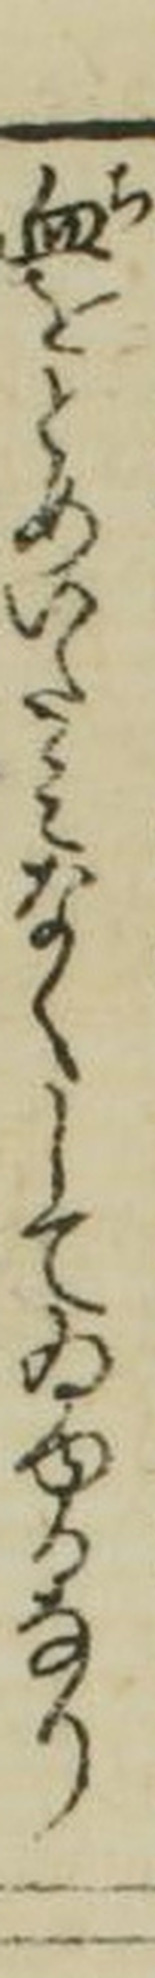血をとめいたみなくしてゐゆるなり
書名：女源氏教訓鑑
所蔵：東京学芸大学附属図書館
